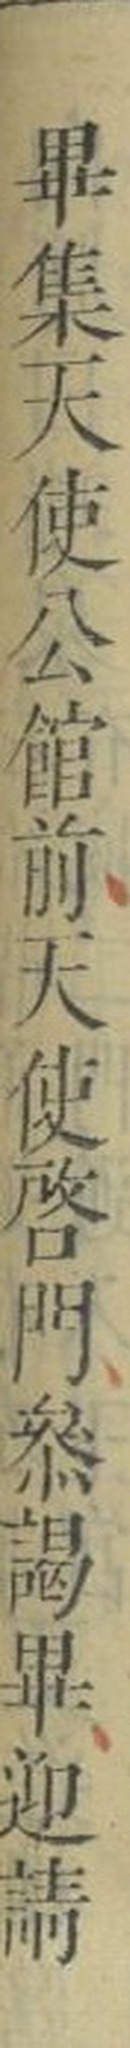畢集天使公館前天使啓門叅謁畢迎請
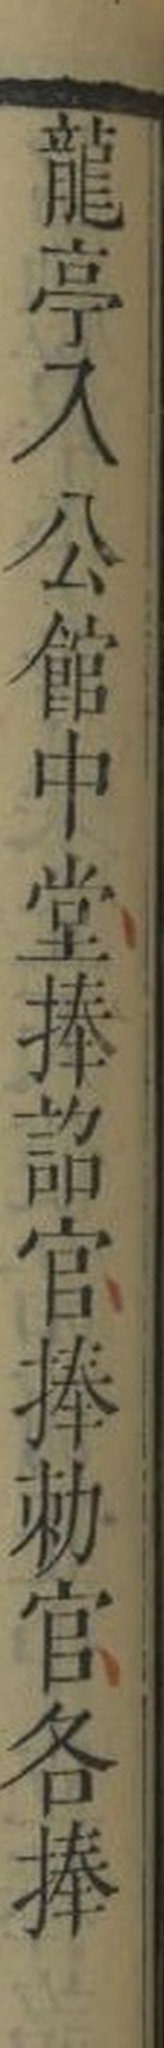龍亭入公館中堂捧詔官捧勅官各捧
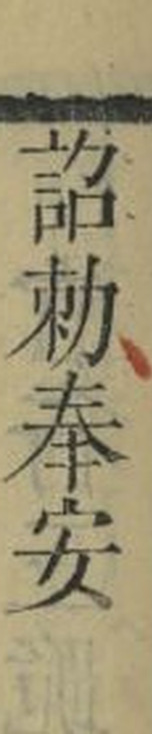詔勅奉安
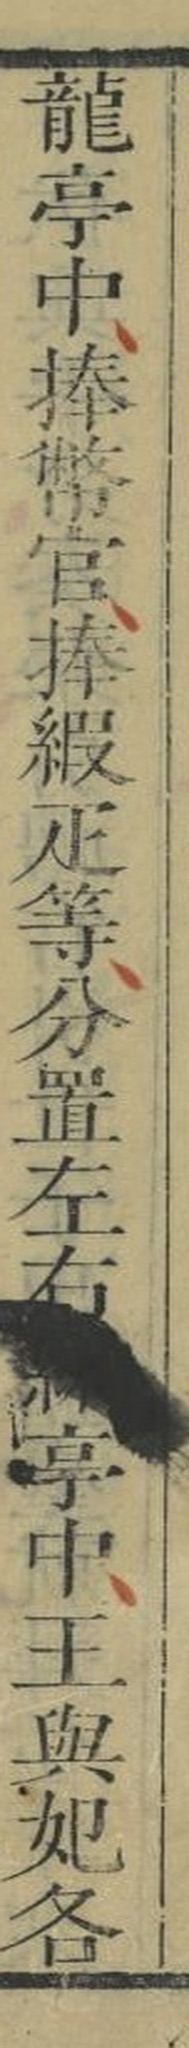龍亭中捧幣官捧縀疋等分置左右綵亭中王與妃各
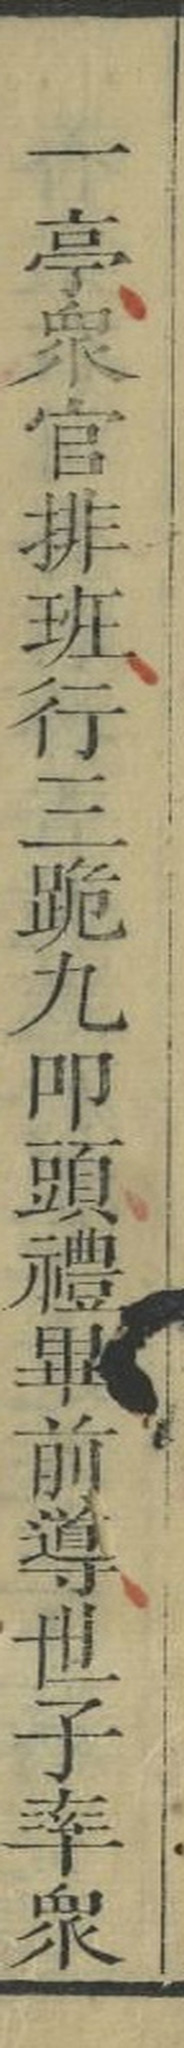一亭衆官排班行三跪九叩頭禮畢前導世子率衆
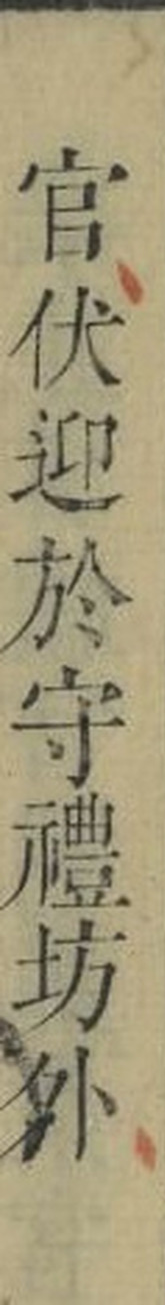官伏迎於守禮坊外
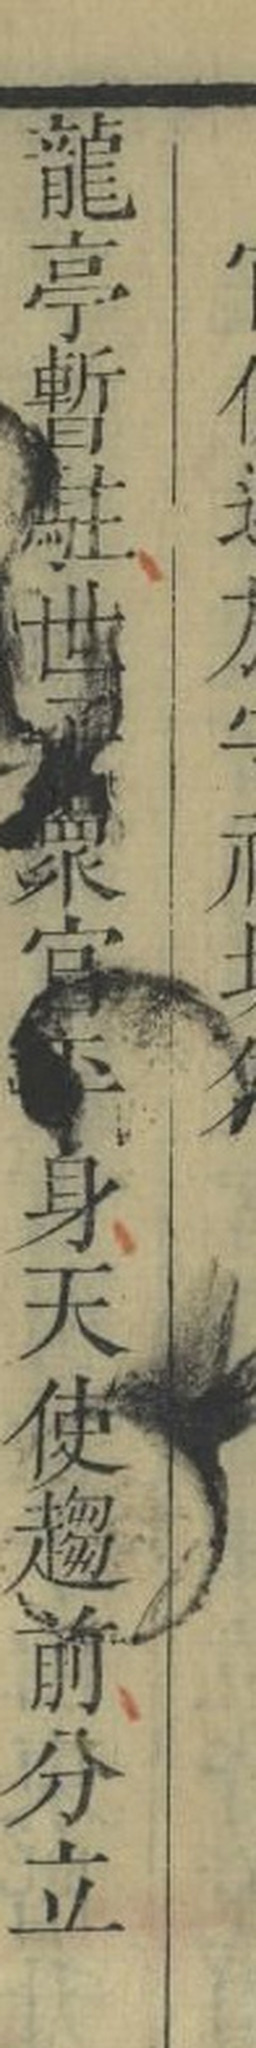龍亭暫駐世子衆官平身天使趨前分立
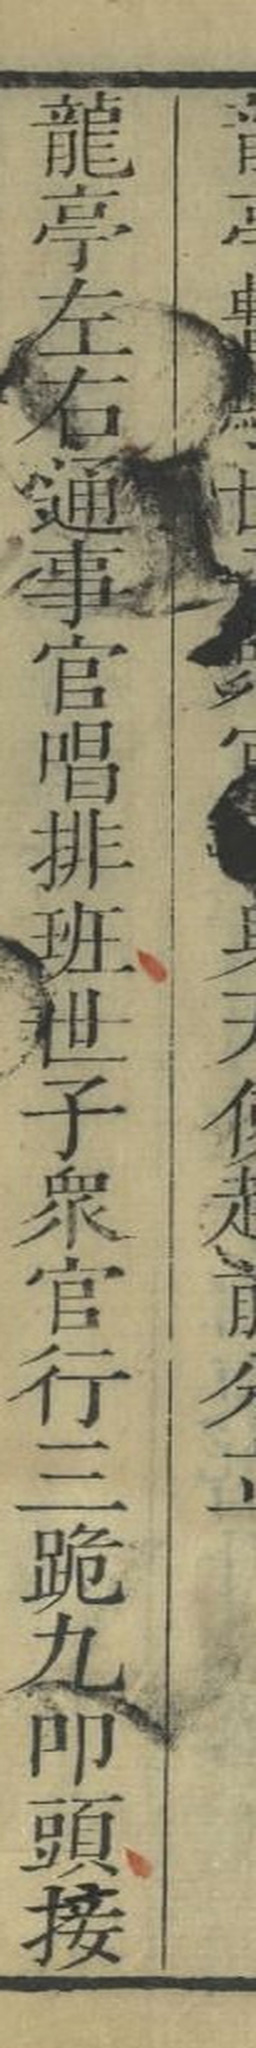龍亭左右通事官唱排班世子衆官行三跪九叩頭接
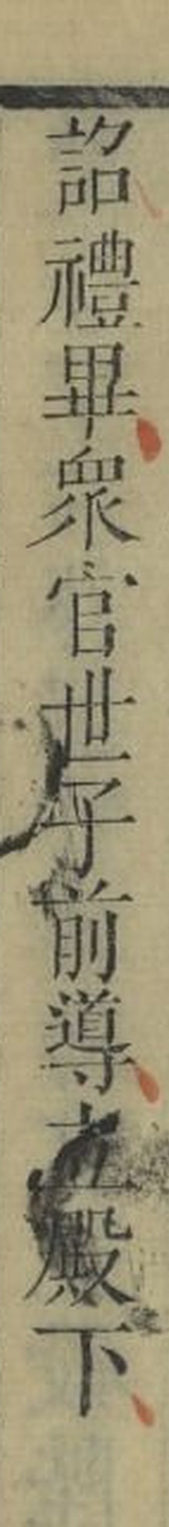詔禮畢衆官世子前導立殿下

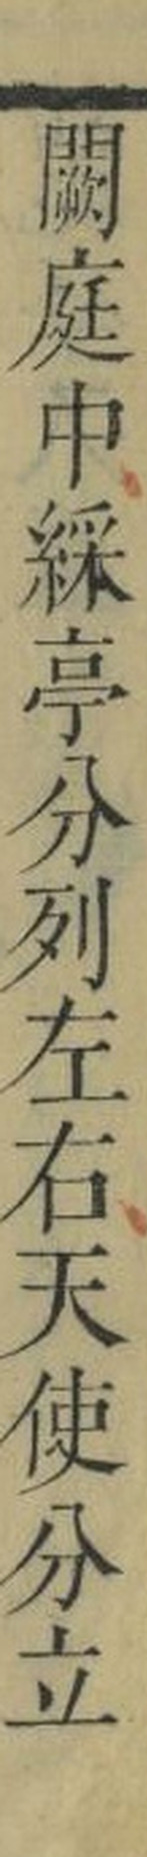闕庭中綵亭分列左右天使分立
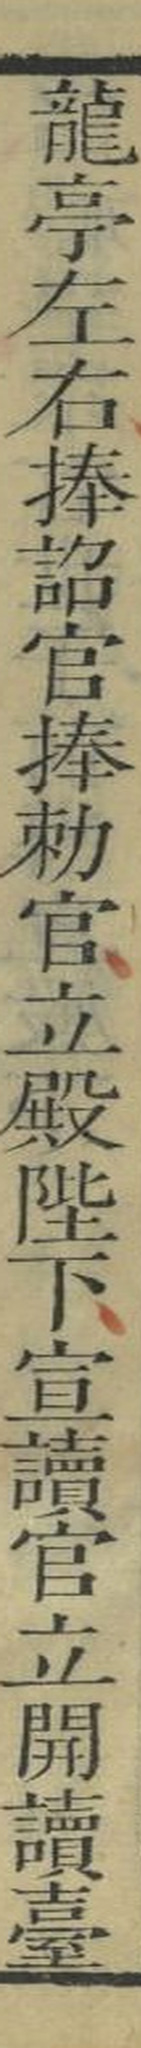龍亭左右捧詔官捧勅官立殿陛下宣讀官立開讀臺
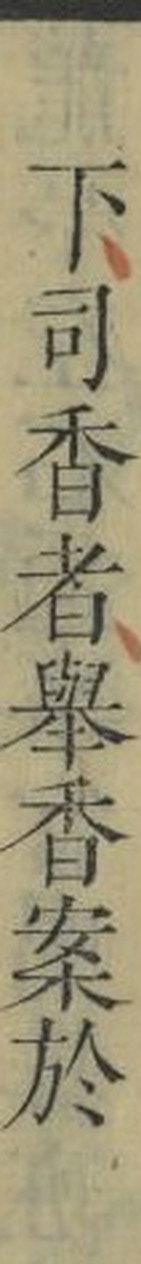下司香者舉香案於
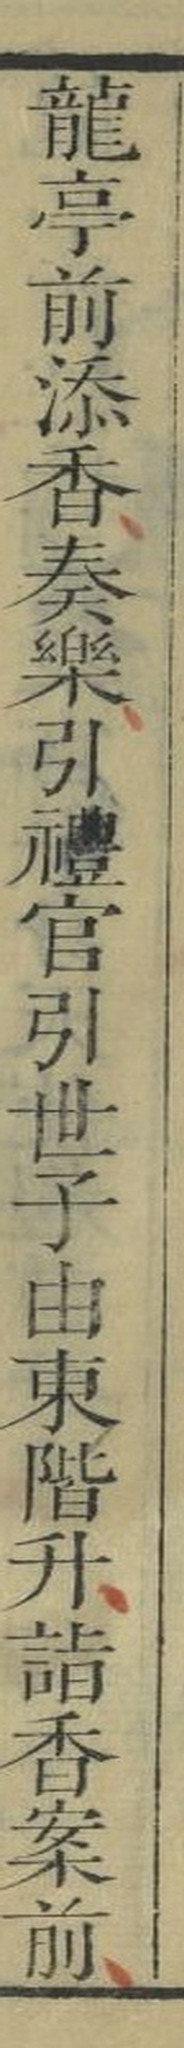龍亭前添香奏樂引禮官引世子由東階升詣香案前
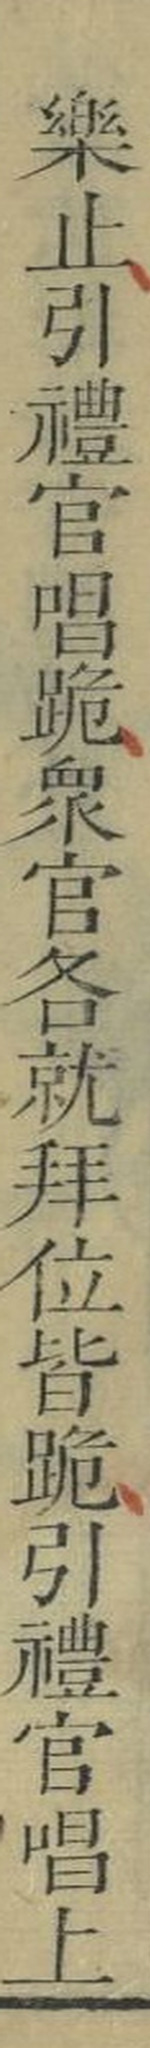樂止引禮官唱跪衆官各就拜位皆跪引禮官唱上
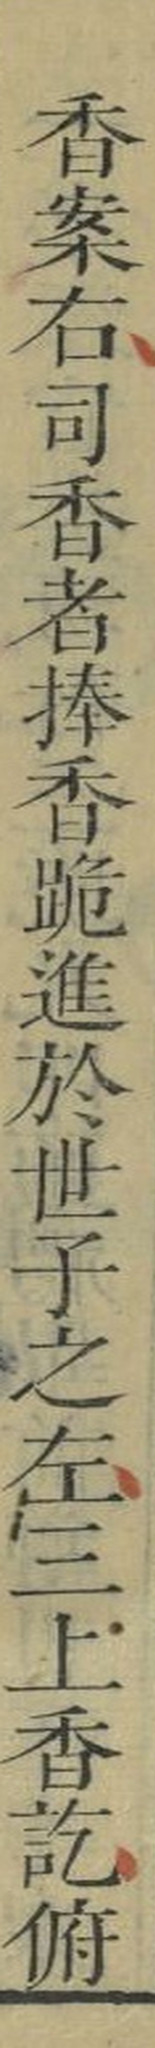香案右司香者捧香跪進於世子之左三上香訖俯
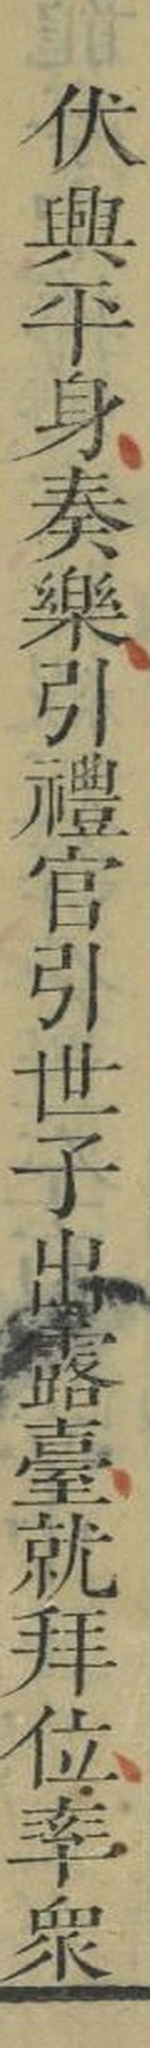伏興平身奏樂引禮官引世子出露臺就拜位率衆
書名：中山伝信録 巻一、巻二
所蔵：University of the Ryukyus Library
